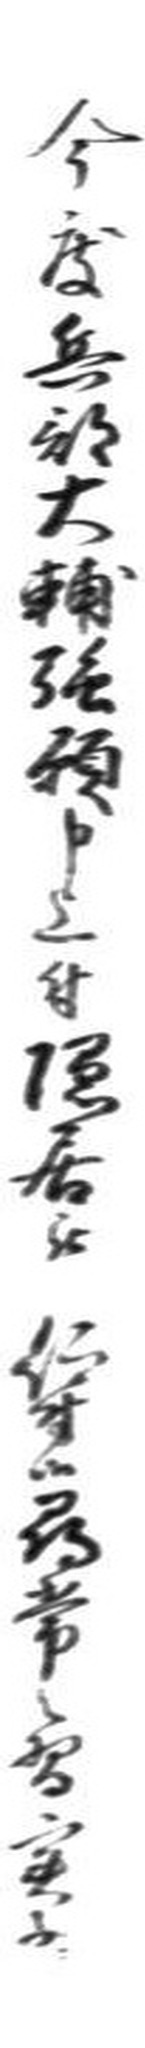今度兵部大輔強願申上付隠居被仰付候尋常之習実子
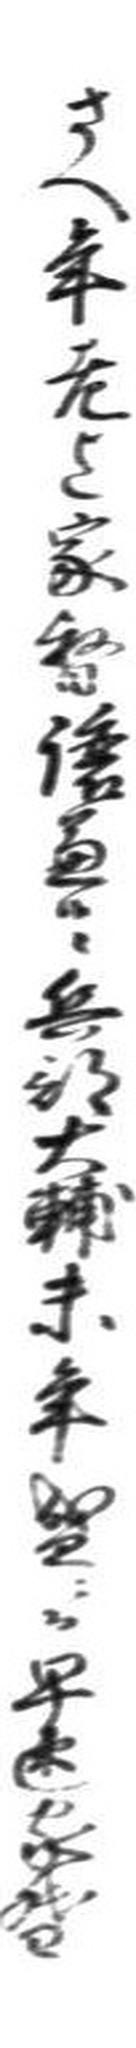さへ年老迄家督譲兼候ニ兵部大輔未年盛ニ而早速家督
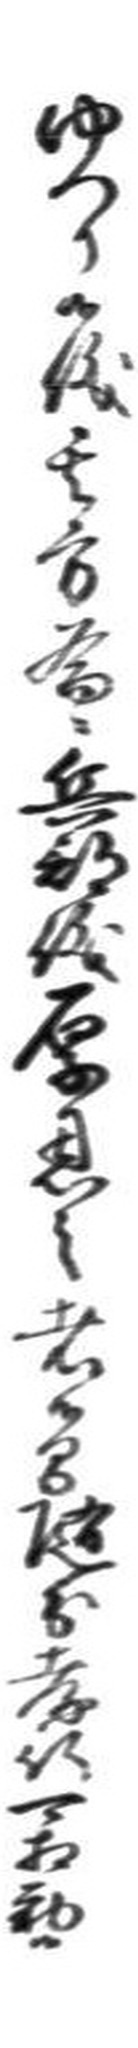ゆつり候儀其方為ニ兵部儀厚恩之者候間随分孝行可相勤候
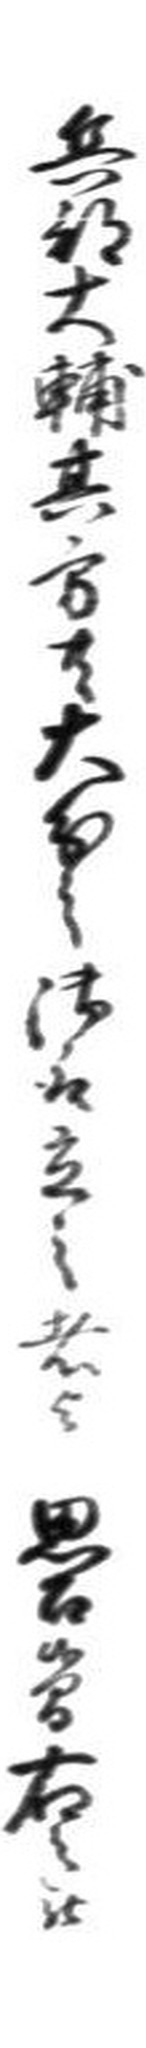兵部大輔其方共大分之御取立之者と思召候間右之被
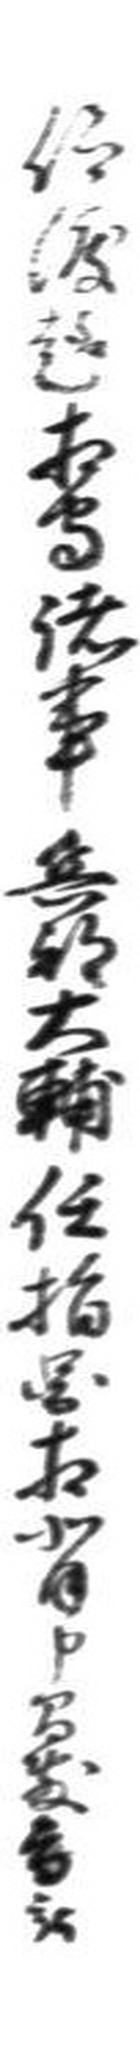仰渡趣相守諸事兵部大輔任指図相背申間敷旨被

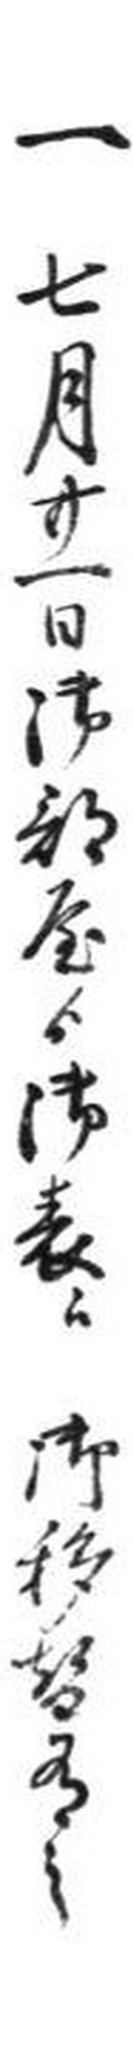一七月廿一日御部屋ゟ御表江御移替有之
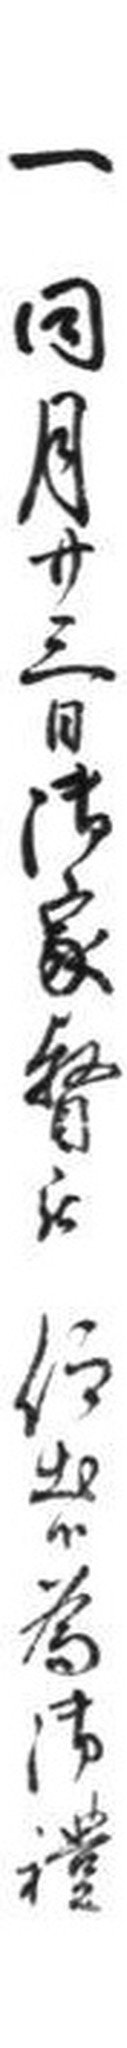一同月廿三日御家督被仰出候為御礼
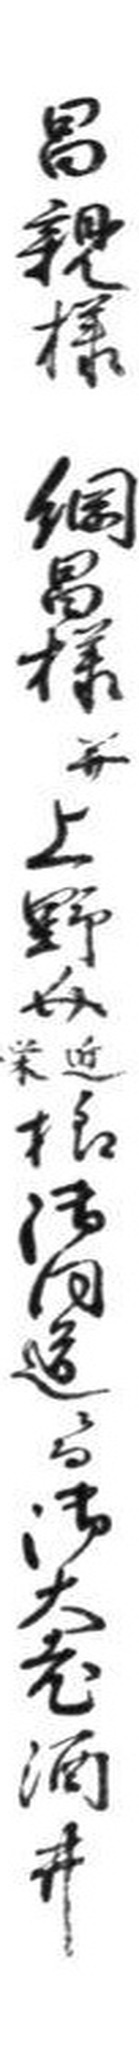昌親様綱昌様并上野介近栄様御同道ニ而御大老酒井
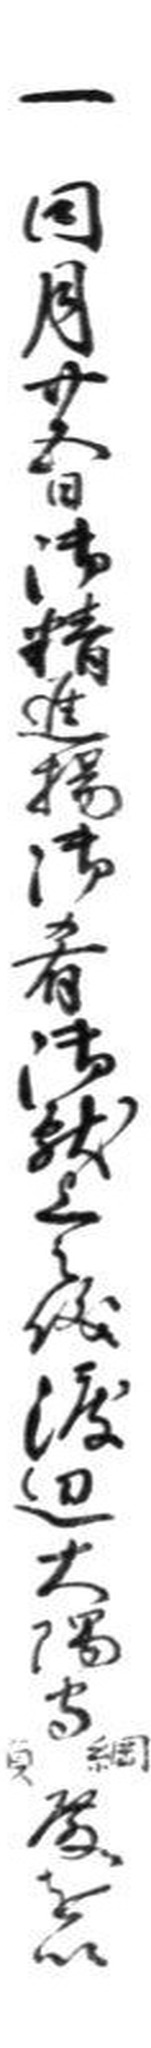一同月廿五日御精進揚御肴御献上之儀渡辺大隅守綱貞殿を以
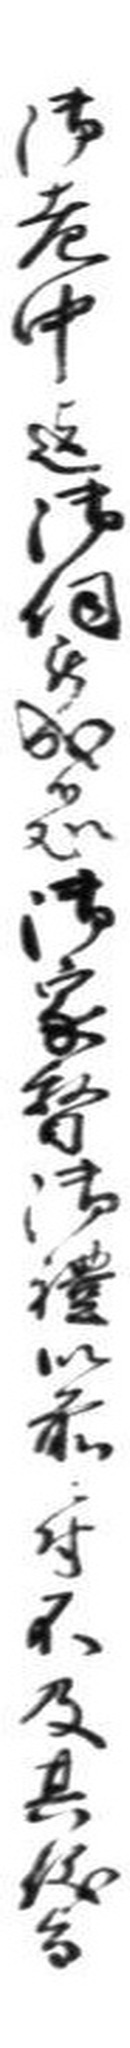御老中迄御伺被成候処御家督御礼以前ニ付不及其儀旨
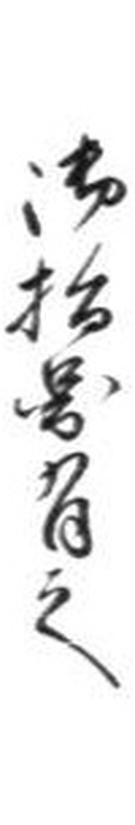御指図有之
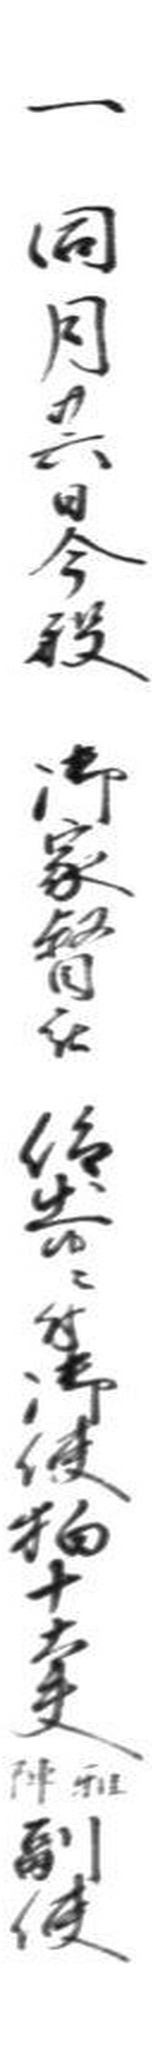一同月廿六日今般御家督被仰出候ニ付御使狛十大夫雅陣副使
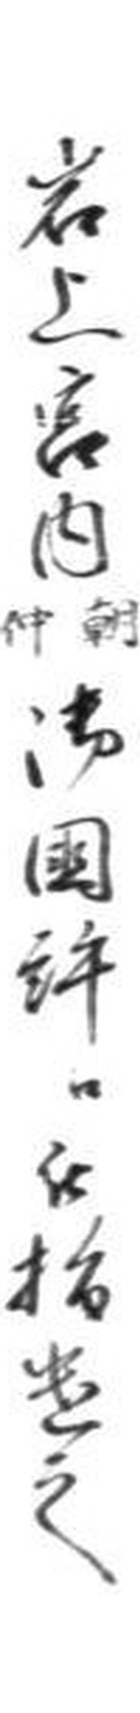岩上宮内朝仲御国許江被指遣之
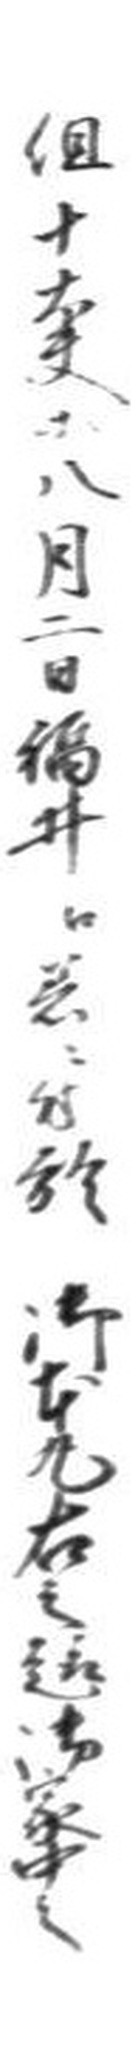但十大夫等八月二日福井江着ニ付於御本丸右之趣御家中之
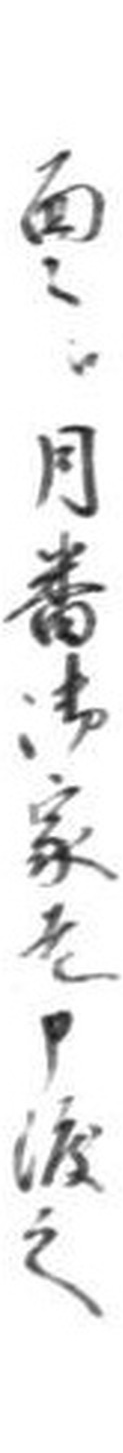面々江月番御家老申渡之
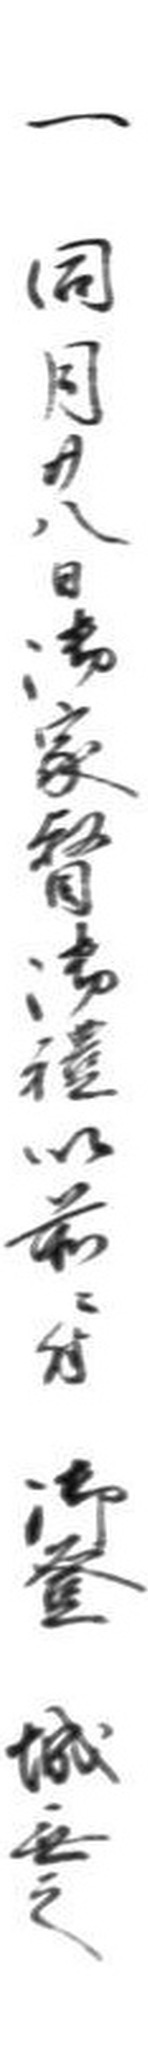一同月廿八日御家督御礼以前ニ付御登城無之
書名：家譜 十三 綱昌公 従寛文元年到延宝五年
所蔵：福井県文書館 Fukui Prefectural Archives
